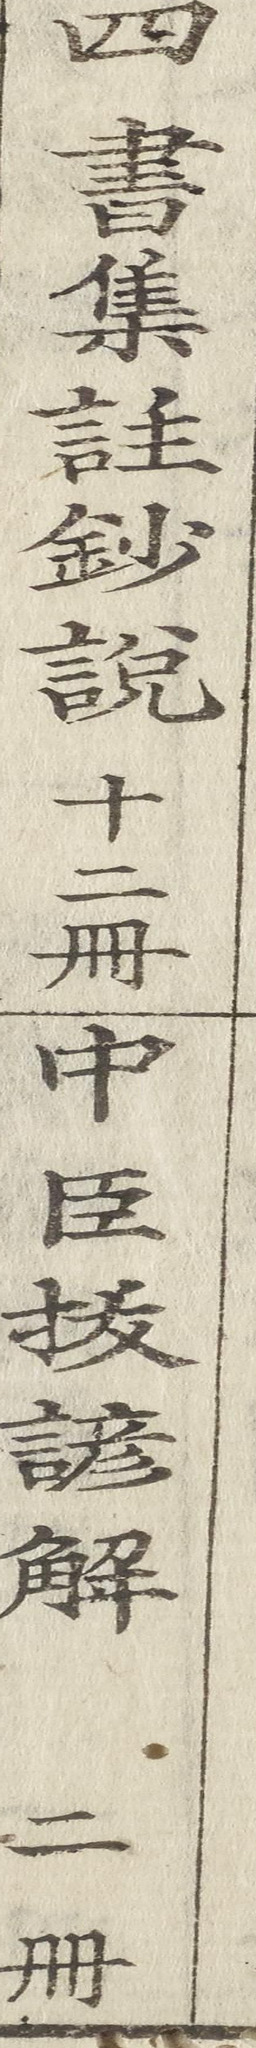四書集註鈔説十二冊中臣抜諺解二冊
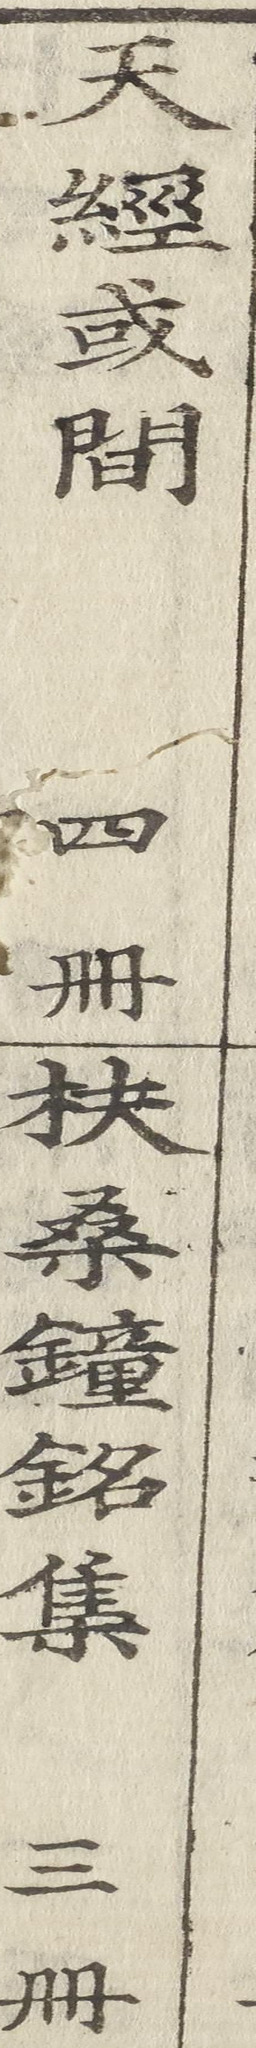天経或間四冊扶桑鐘銘集三冊
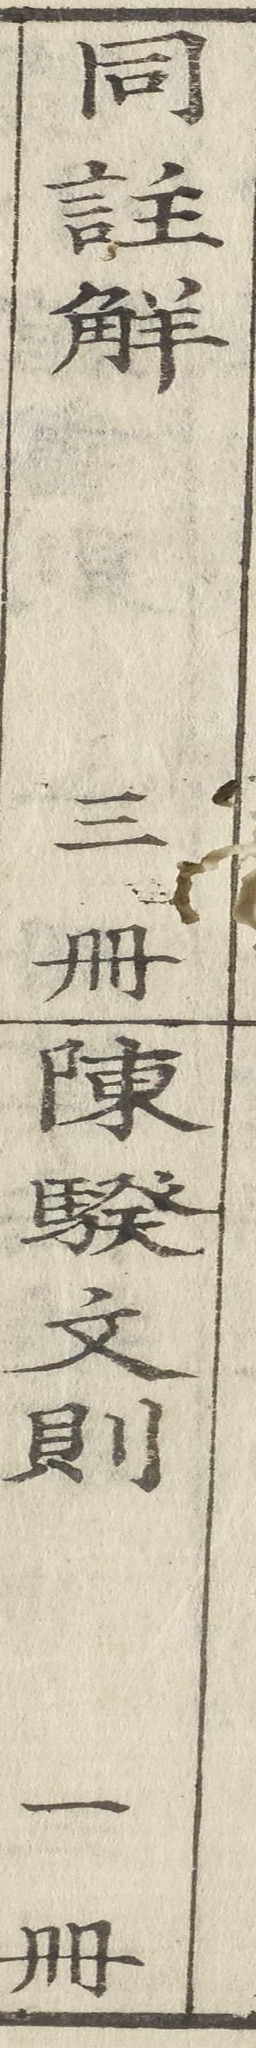同註解三冊陳騤文則一冊
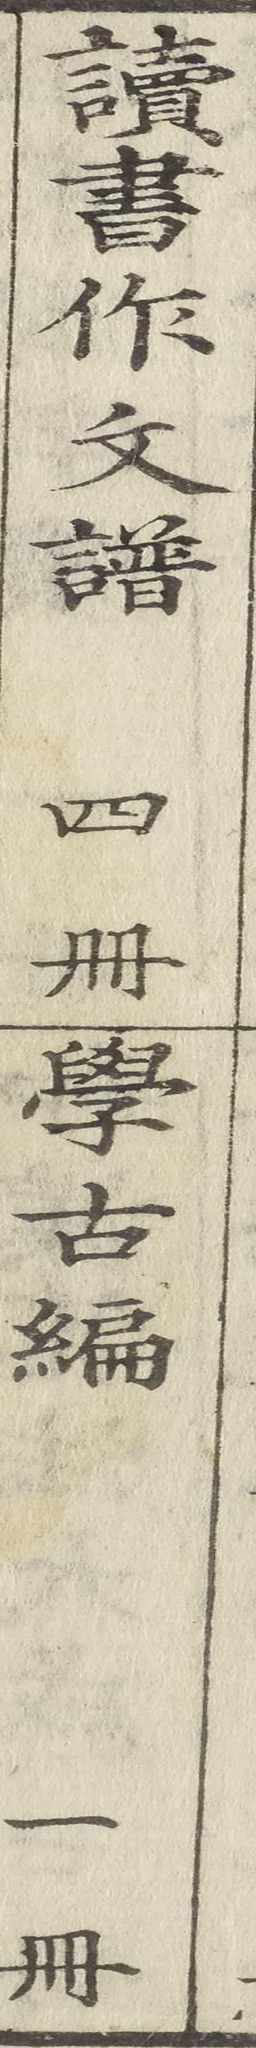読書作文譜四冊学古編一冊

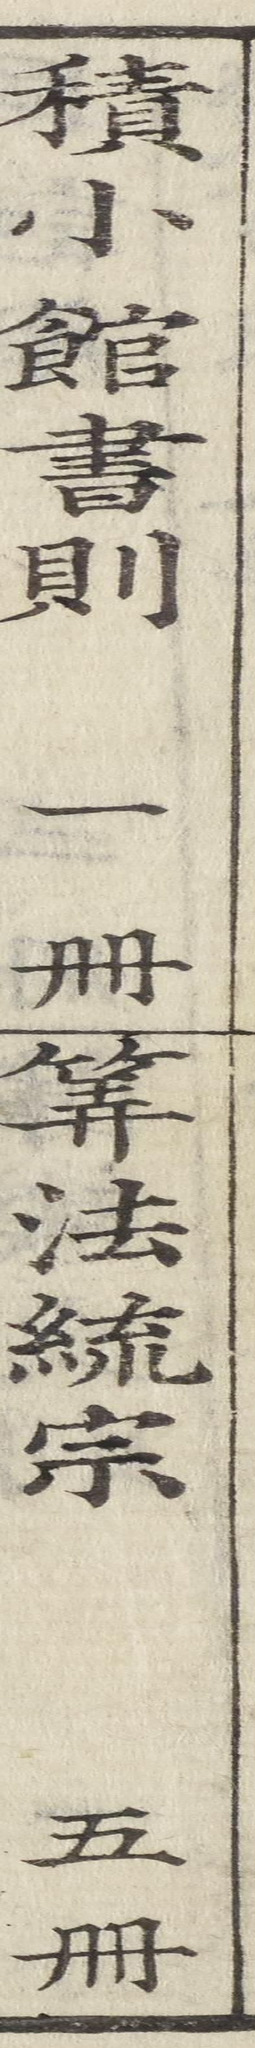積小館書則一冊算法統宗五冊
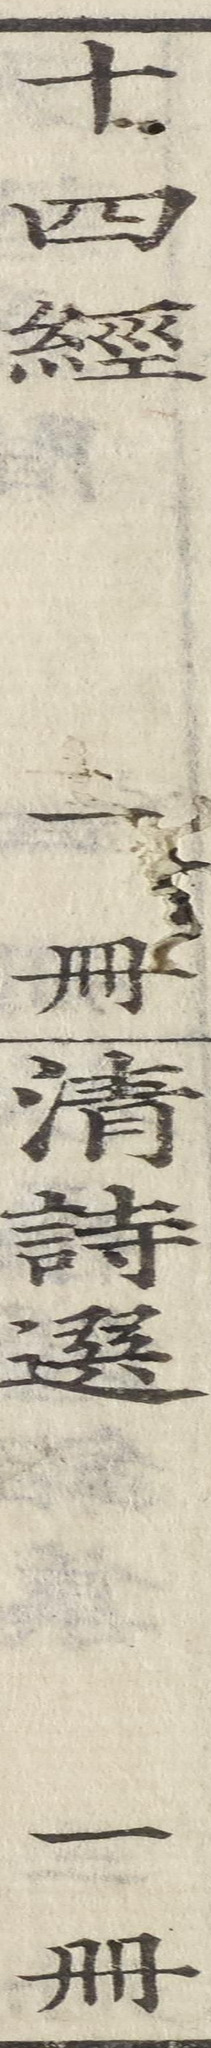十四経一冊清詩選一冊
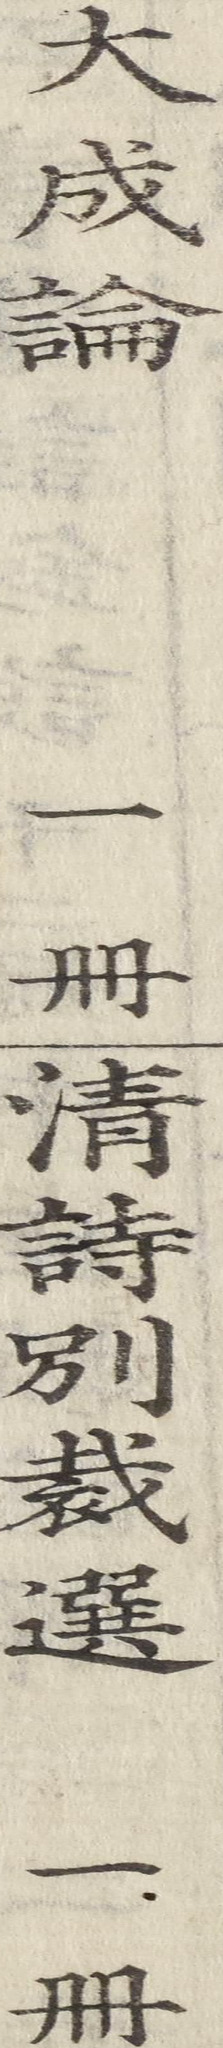大成論一冊清詩別裁選一冊
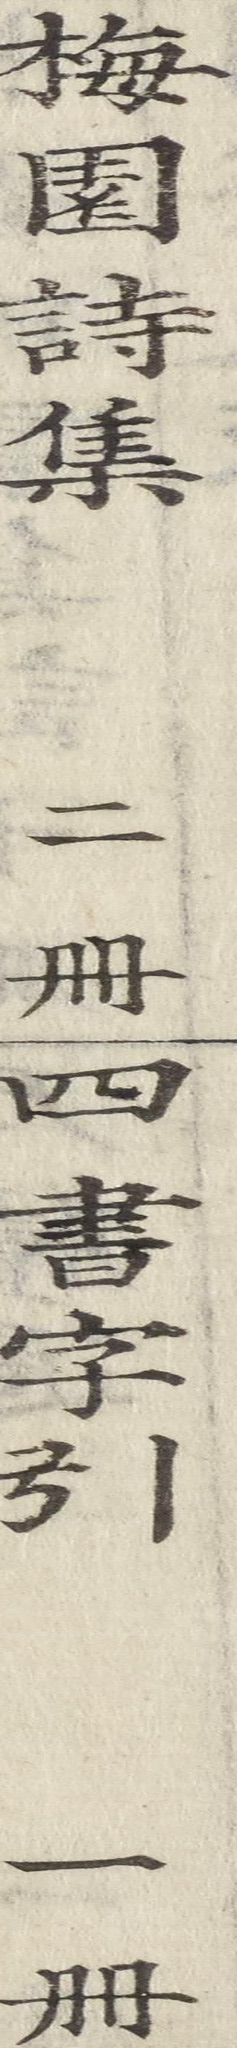梅園詩集二冊四書字引一冊
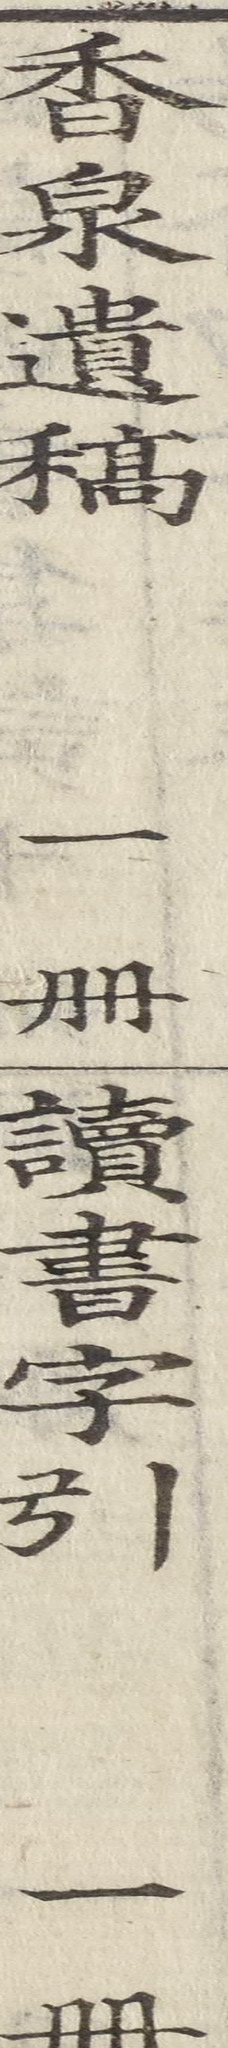香泉遺稿一冊読書字引一冊
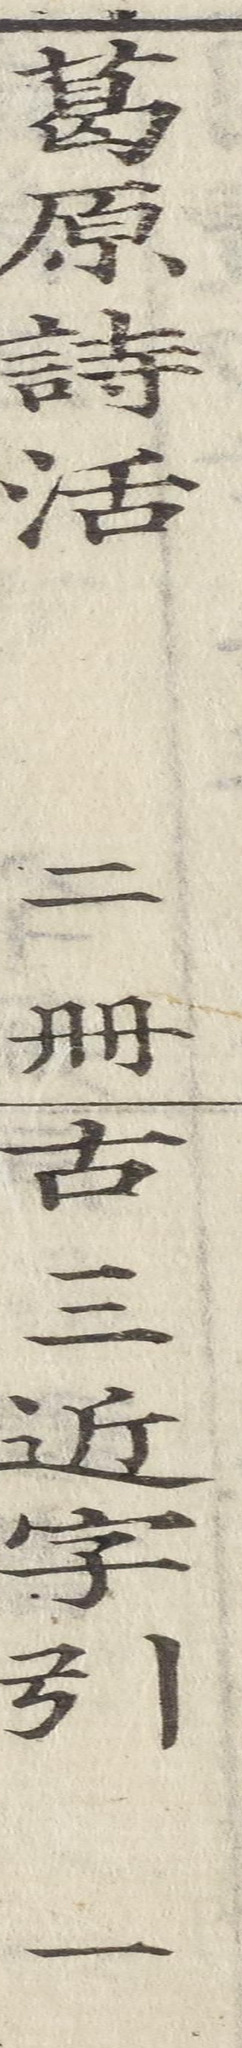葛原詩活二冊古三近字引一冊
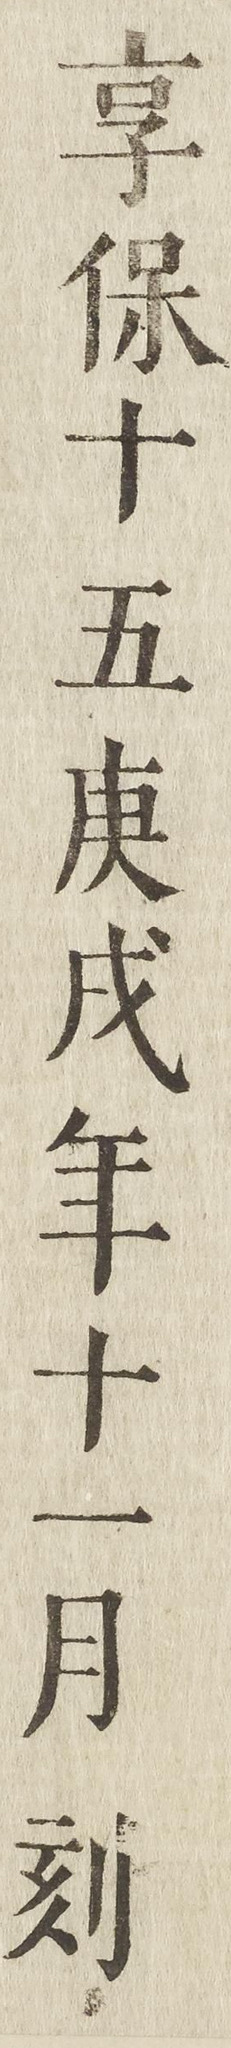享保十五庚戌年十一月刻
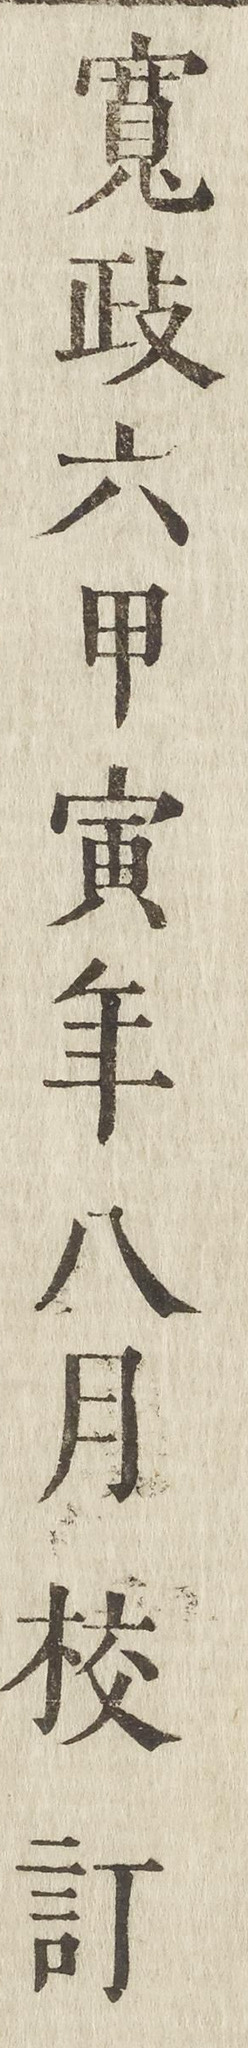寛政六甲寅年八月校訂
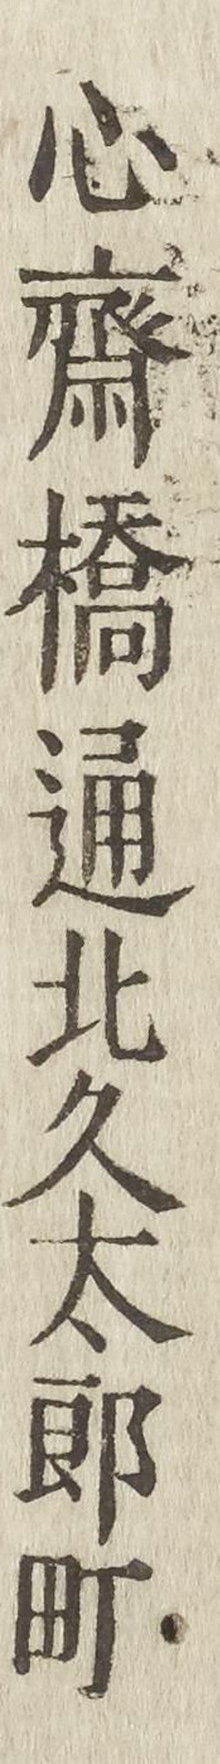心斎橋通北久太郎町
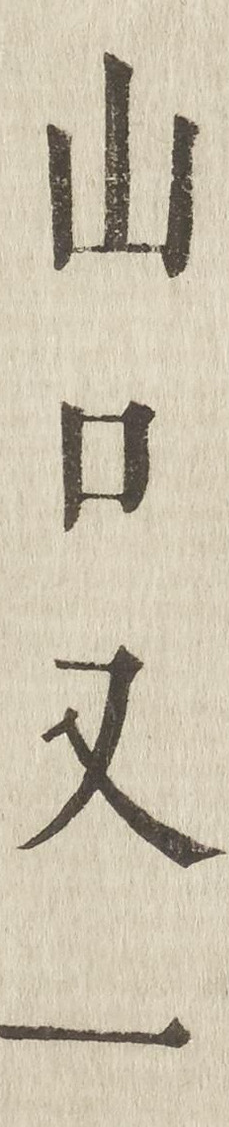山口又一
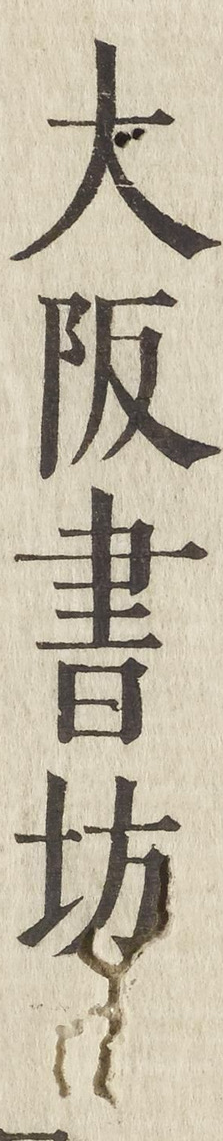大阪書坊
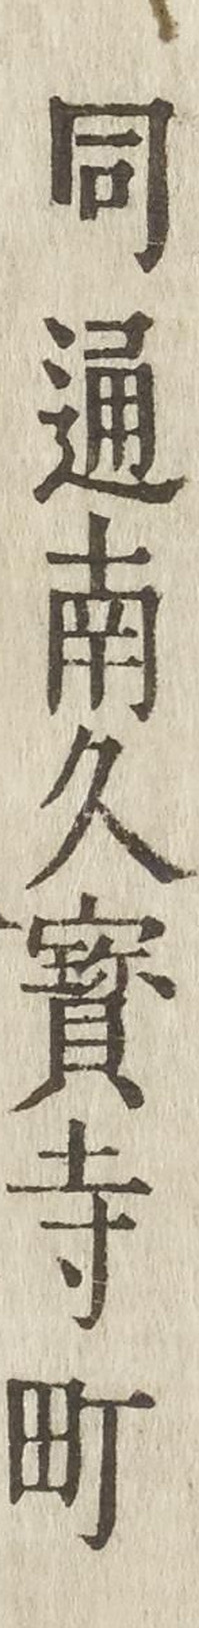同通南久宝寺町
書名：天經或問　地
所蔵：東京大学地震研究所図書室 Earthquake Research Institute Library, The University of Tokyo, JAPAN
